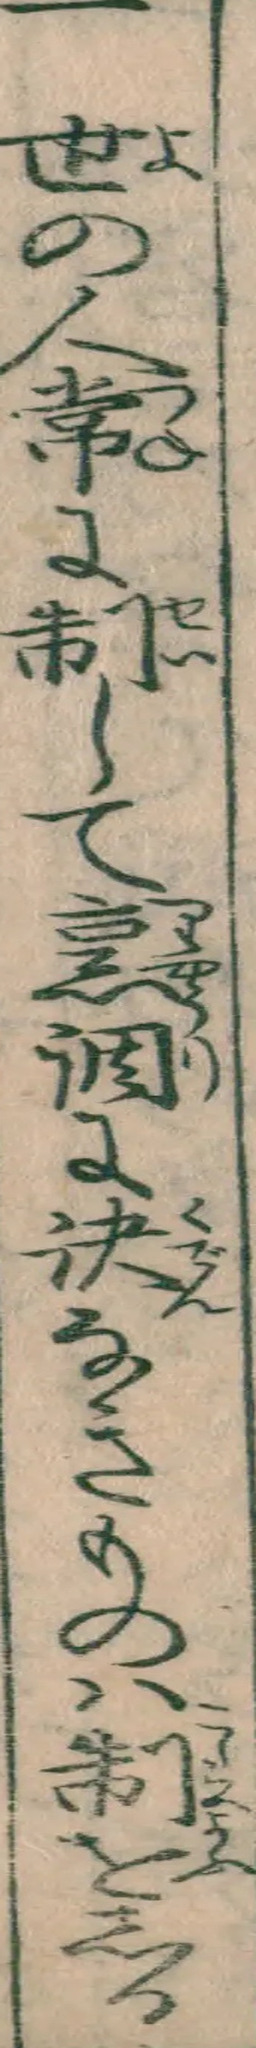一世の人常に制して烹調に訣なきものは制をしる
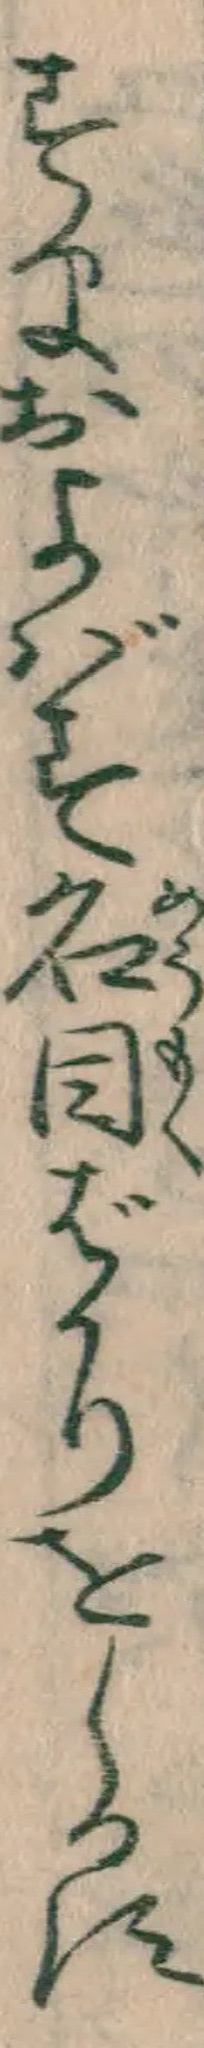すにおよばす名目ばかりをしるす
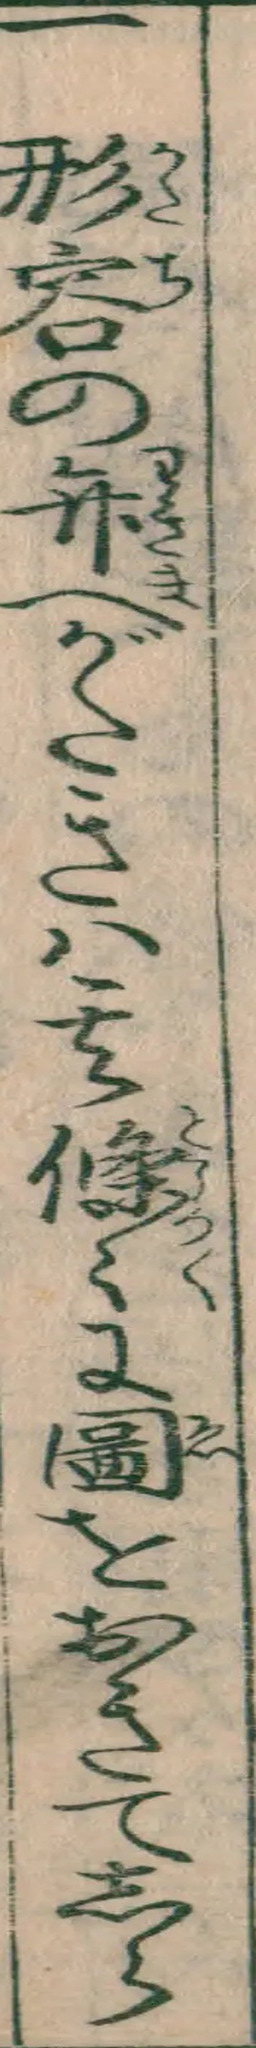一形容の弁へがたきは其条々に図をおきてしら
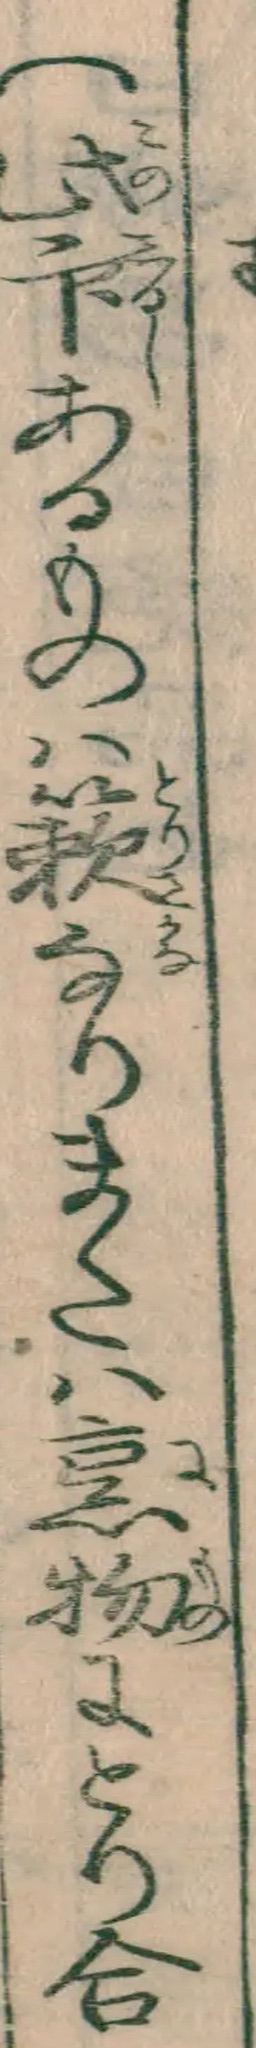一(此印あるものは簌なりまたは烹物にとり合
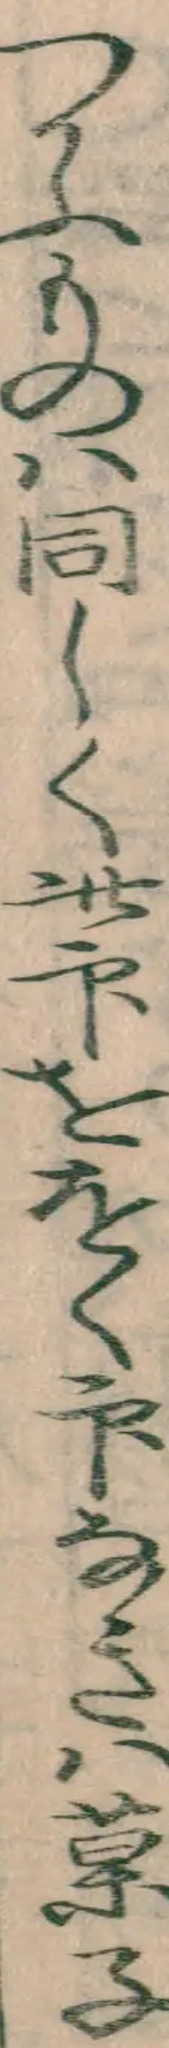つかふものは同しく此印ををく印なきは菓子
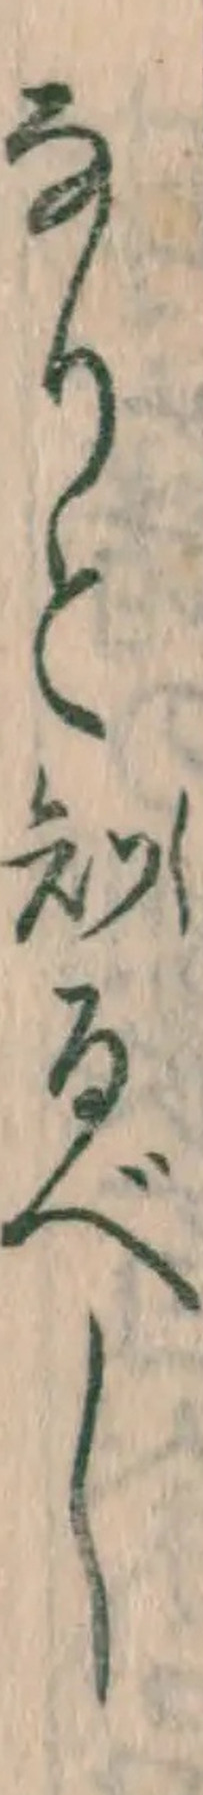なりと知るべし
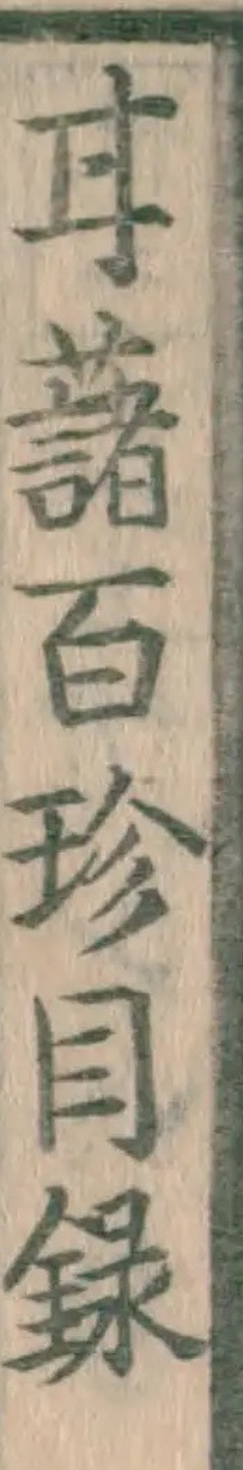甘藷百珍目録

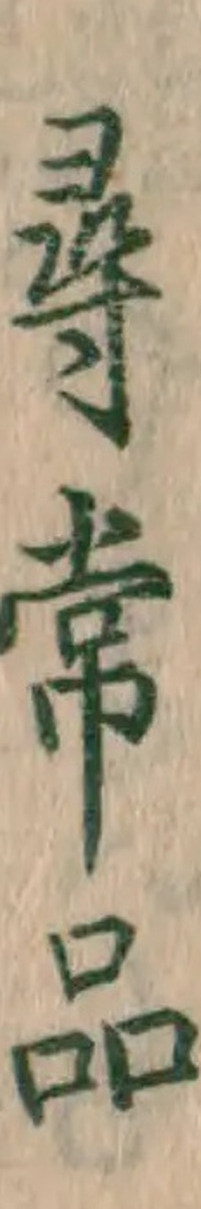尋常品

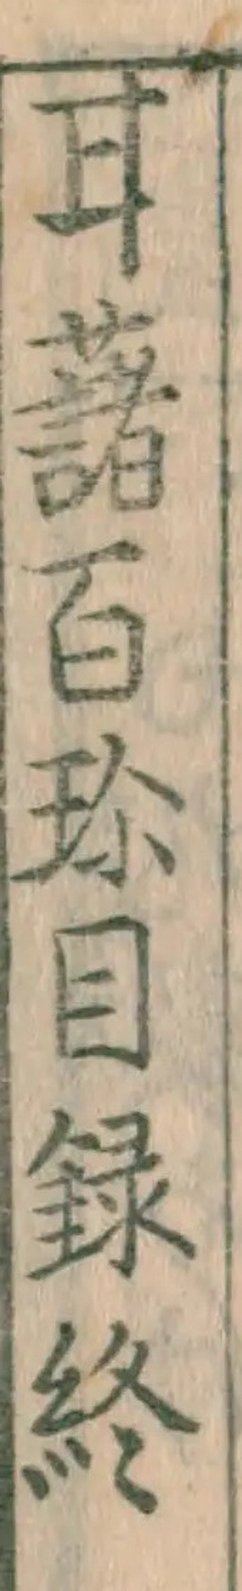甘藷百珍目録終
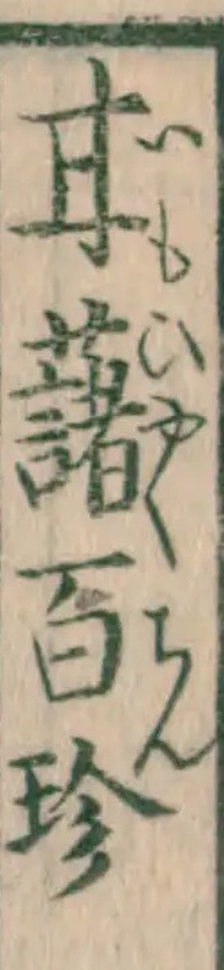甘藷百珍
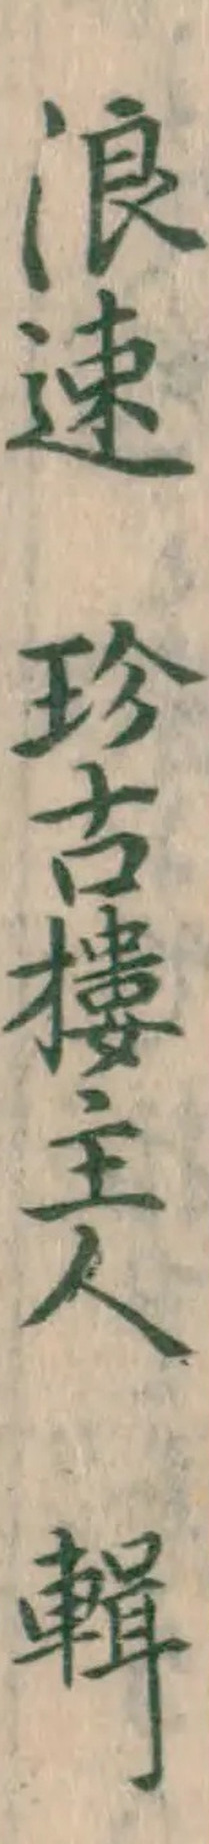浪速珍古楼主人輯
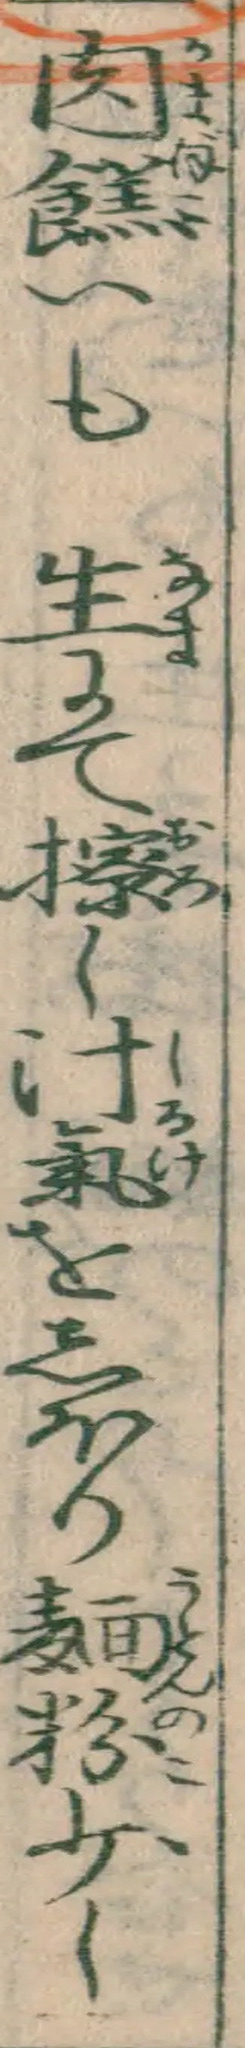[一]肉餻いも生にて擦し汁気をしほり麺粉少し
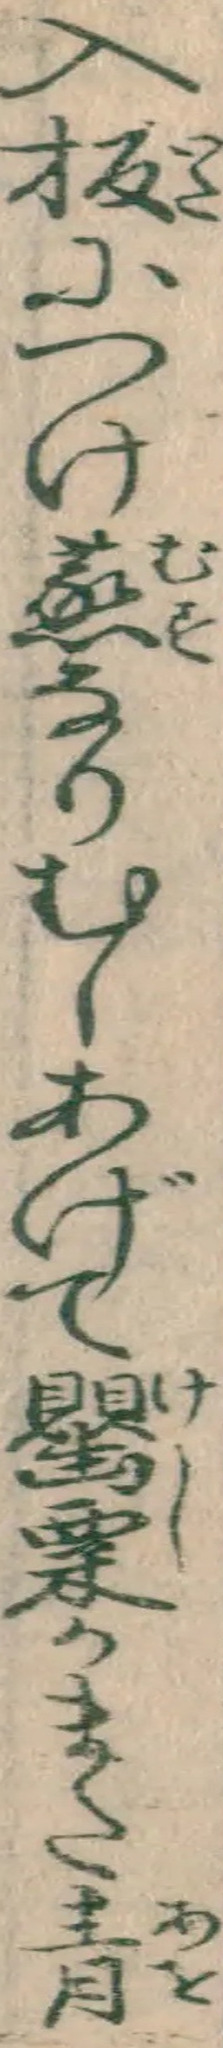入板につけ蒸なりむしあげて罌粟かまた青
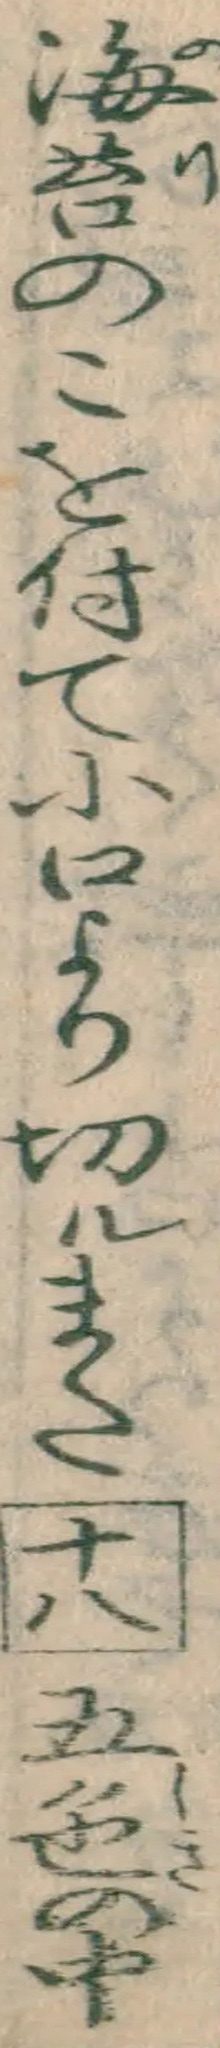海苔のこを付て小口より切ルまた[十八]五色の中
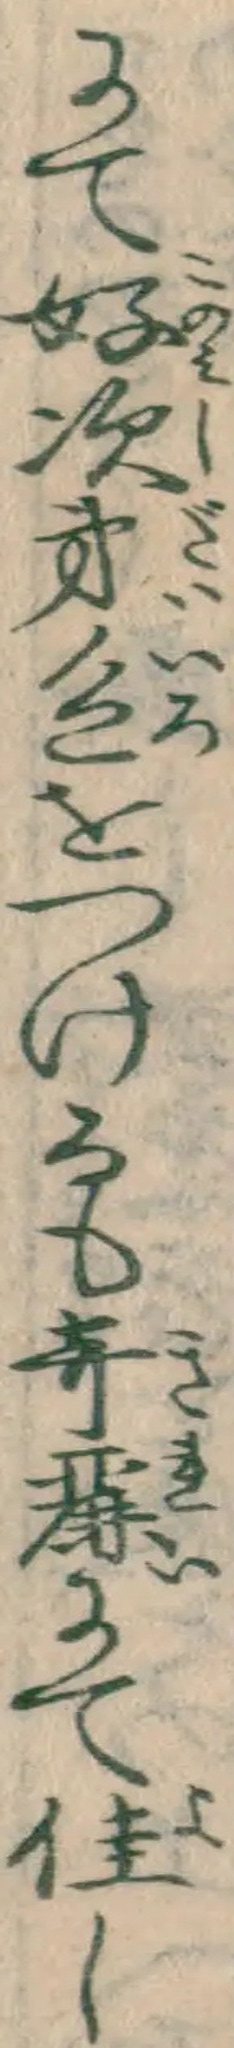にて好次第色をつけるも奇麗にて佳し
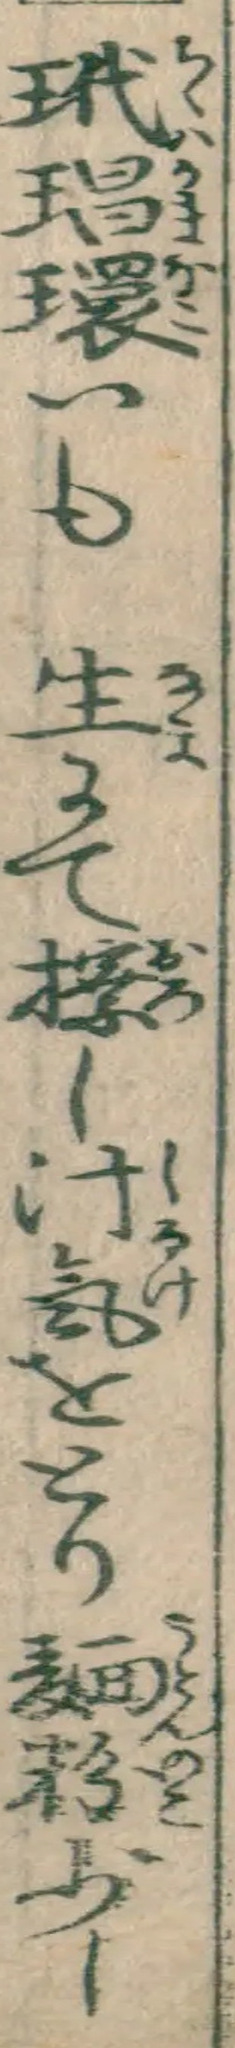[二]玳琩環いも生にて擦し汁気をとり麺粉少し
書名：甘藷百珍
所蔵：国立国会図書館 National Diet Library, JAPAN
